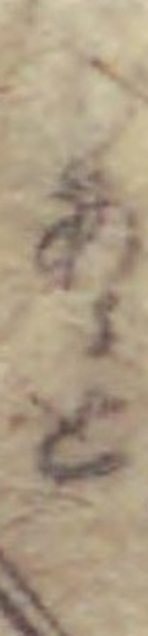あゝと

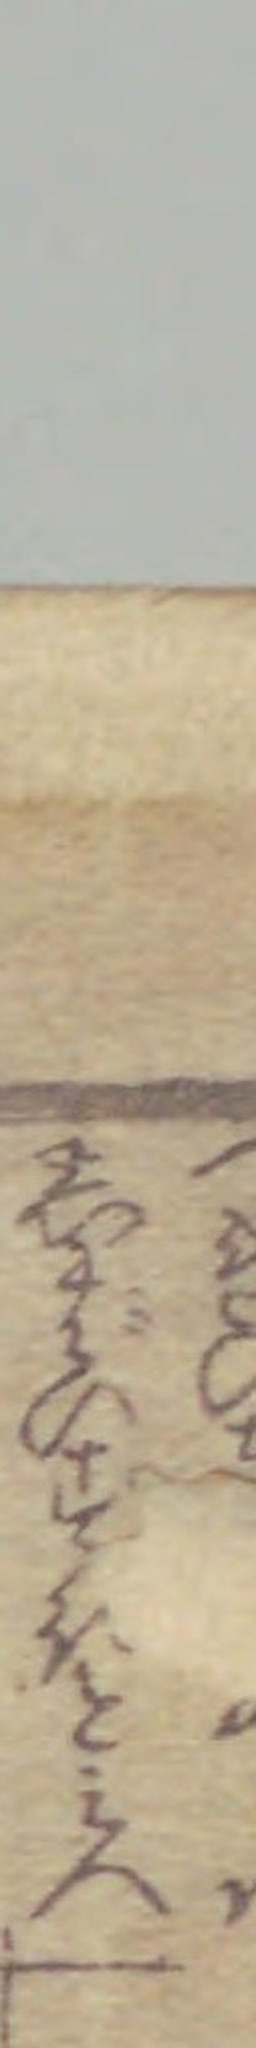しばいすきとみへ
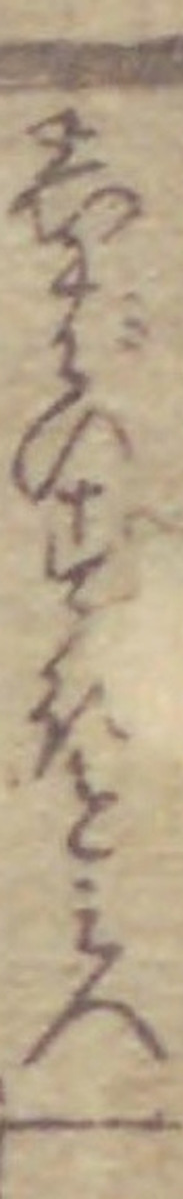しばいすきとみへ
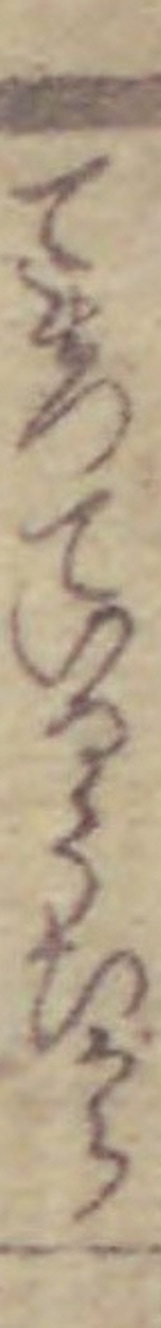てまつているうちから
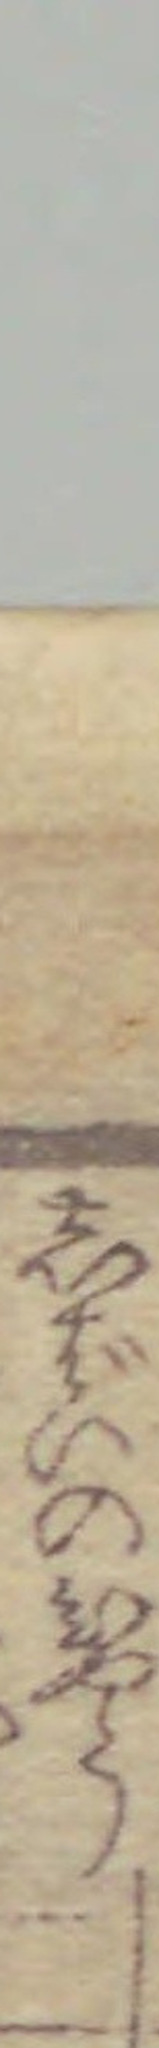しばいのひやう
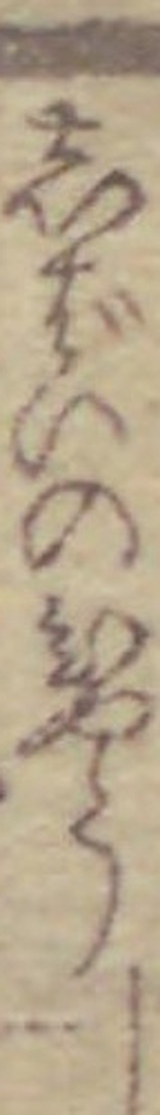しばいのひやう
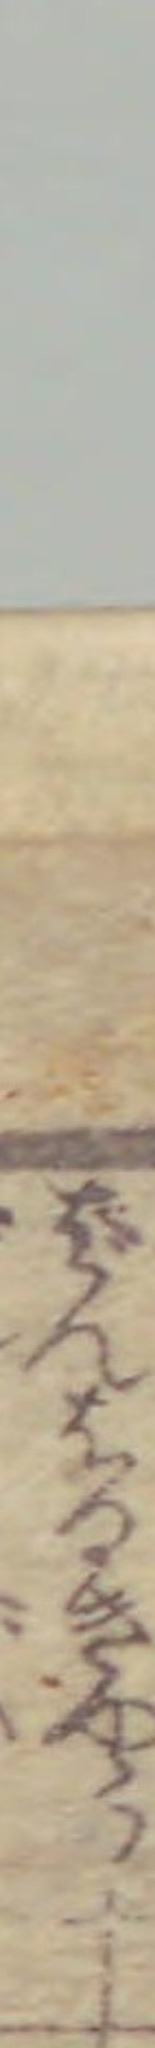ばんはるきやう
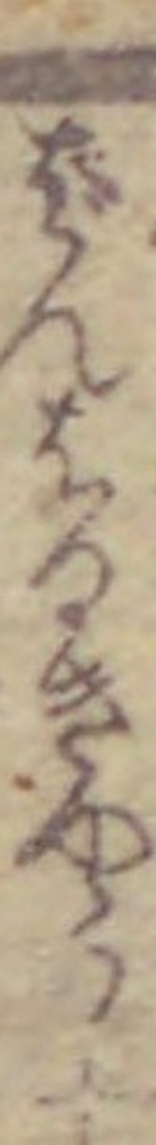ばんはるきやう
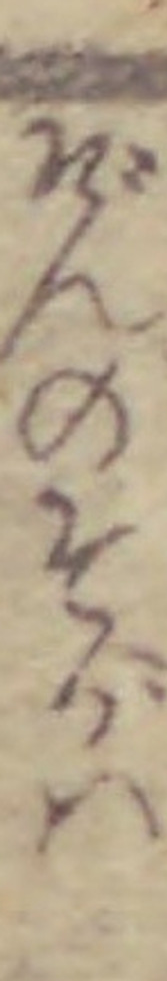げんのそがは
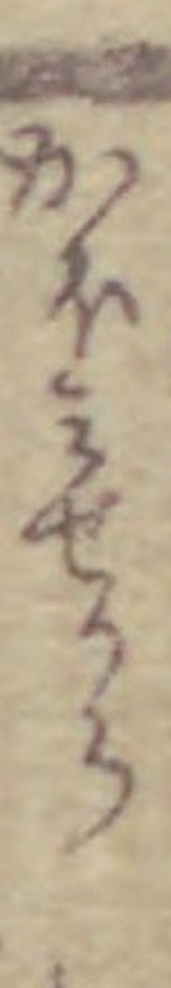かほみせから
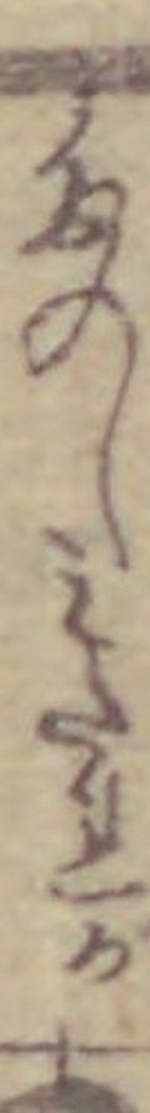たのしみたれが
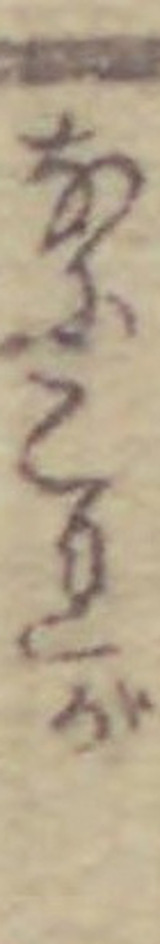なにこれが
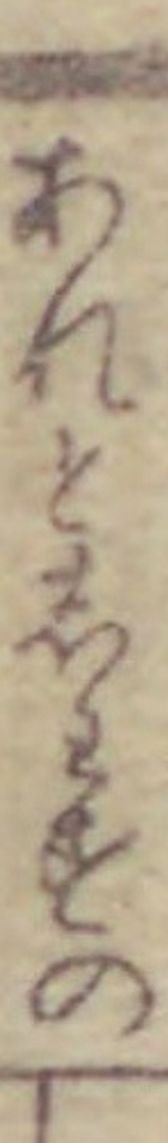あれとしわすの
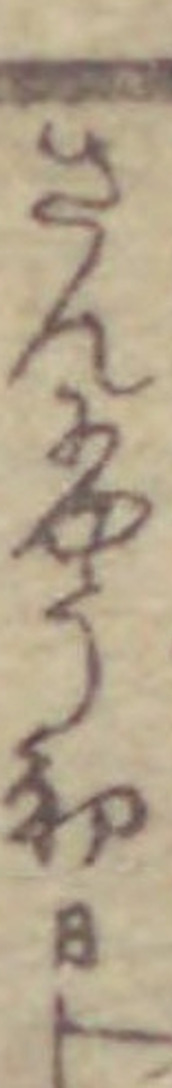さんにやう初日
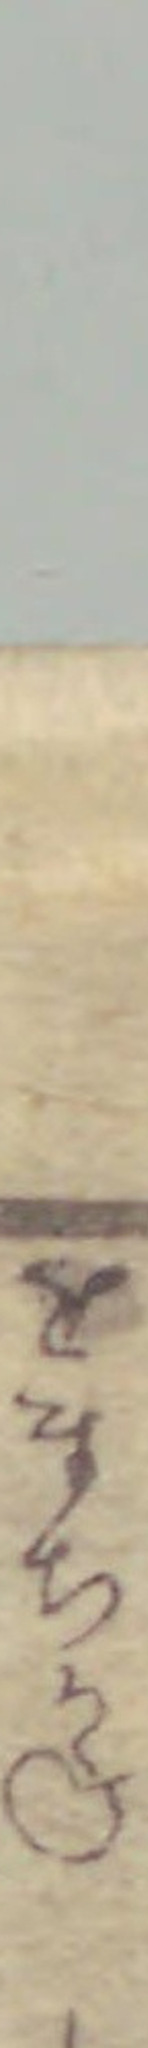をまちかね
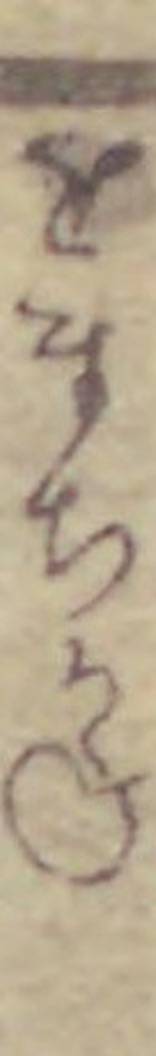をまちかね
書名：思事夢濃枕 3巻
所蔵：国立国会図書館 National Diet Library, JAPAN
